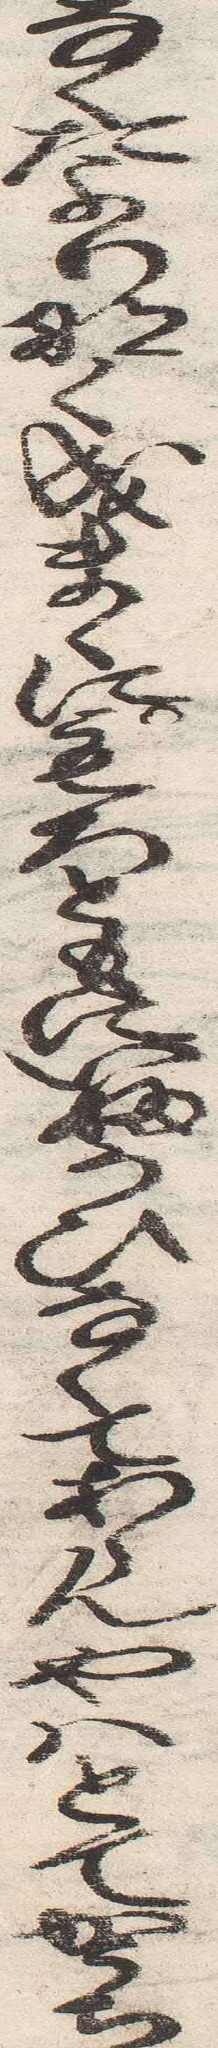なくたよりなく成まゝに。もろともにいふかひなくてあらんやはとてかうち
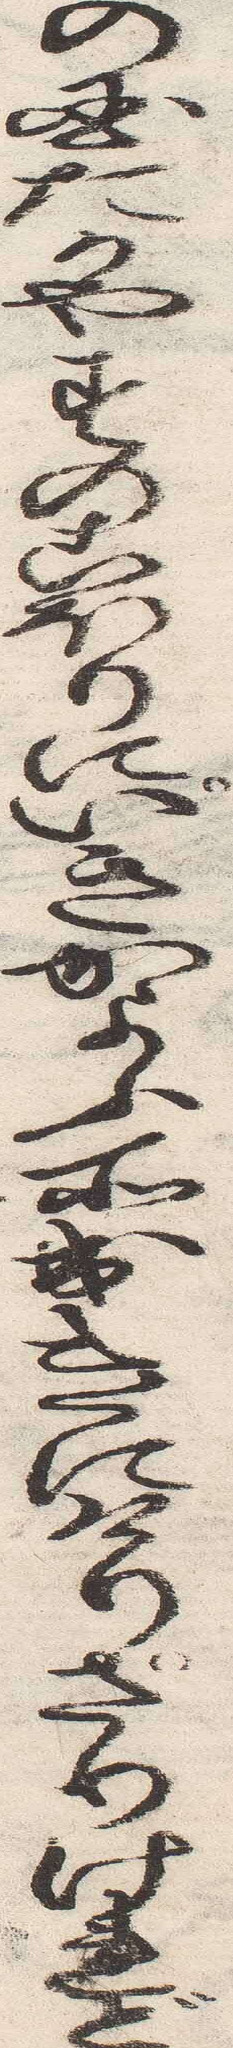の国たかやすのこほりに。いきかよふ所出きにけり。さりけれど
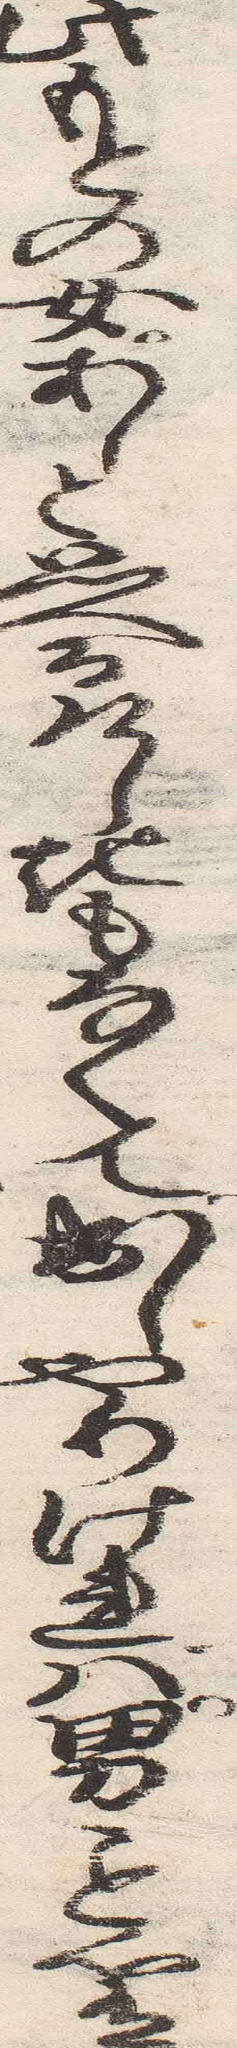此もとの女あしと思へるけしきもなくて出しやりければ。男こと心有
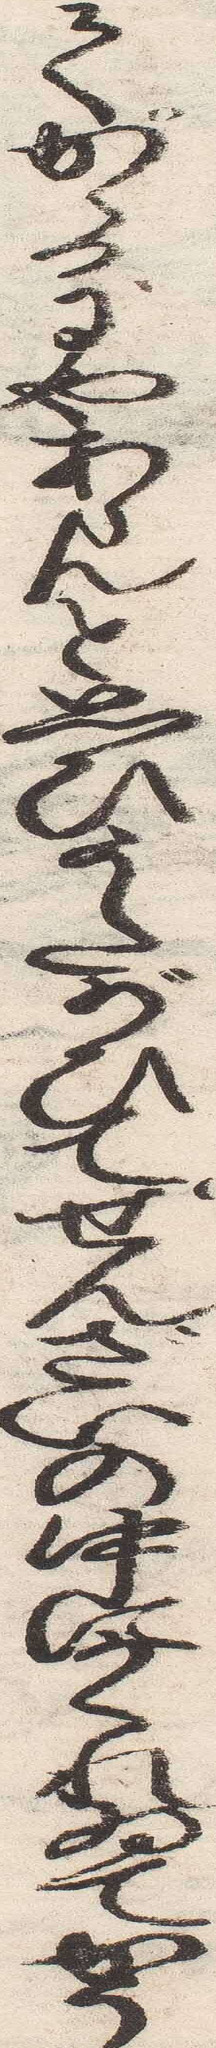て。かゝるにやあらんと思ひうたがひて。せんざいの中にかくれゐてかう
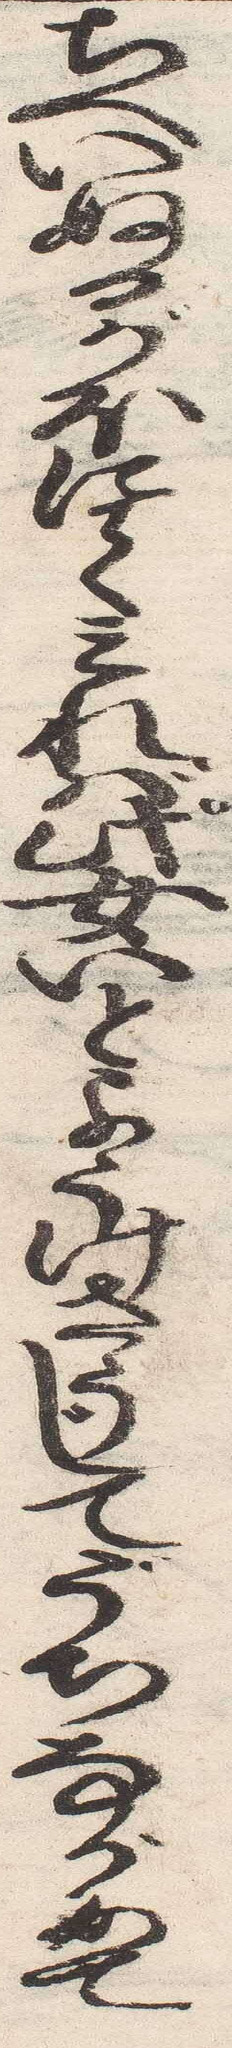ちへいぬるがほにてみれば。女いとようけさうじて。うちながめて
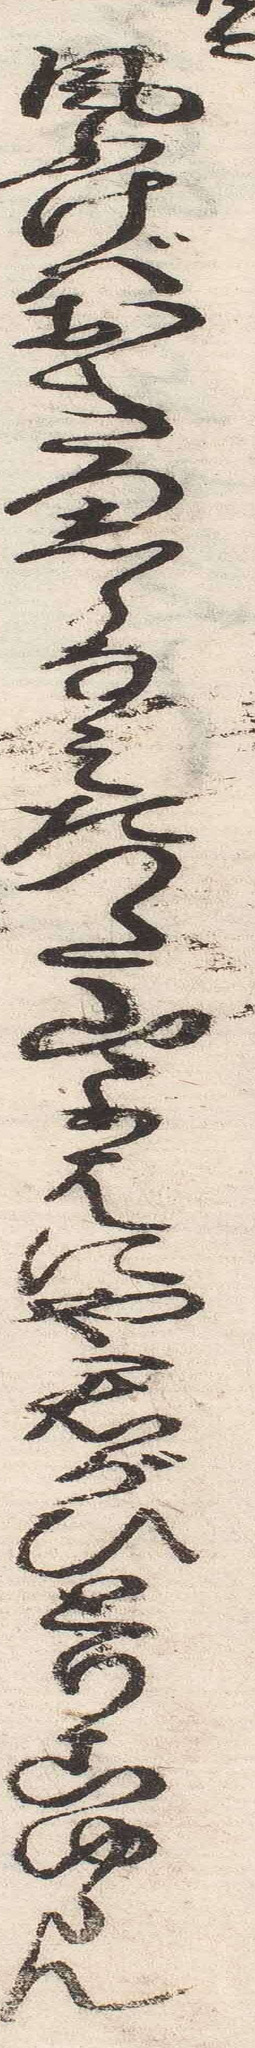古今風ふけばおきつしらなみたつた山よはにや君がひとりこゆらん
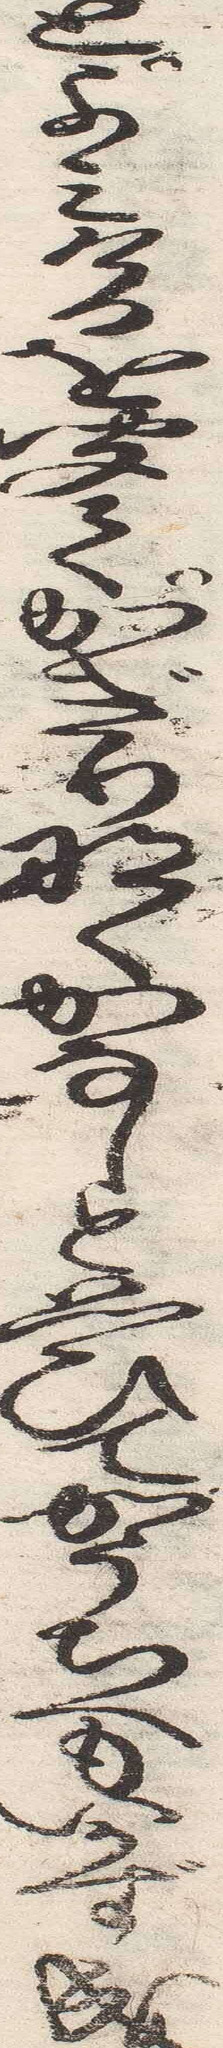と。よみけるを聞て。かぎりなくかなしと思ひて。かうちへもいかず成
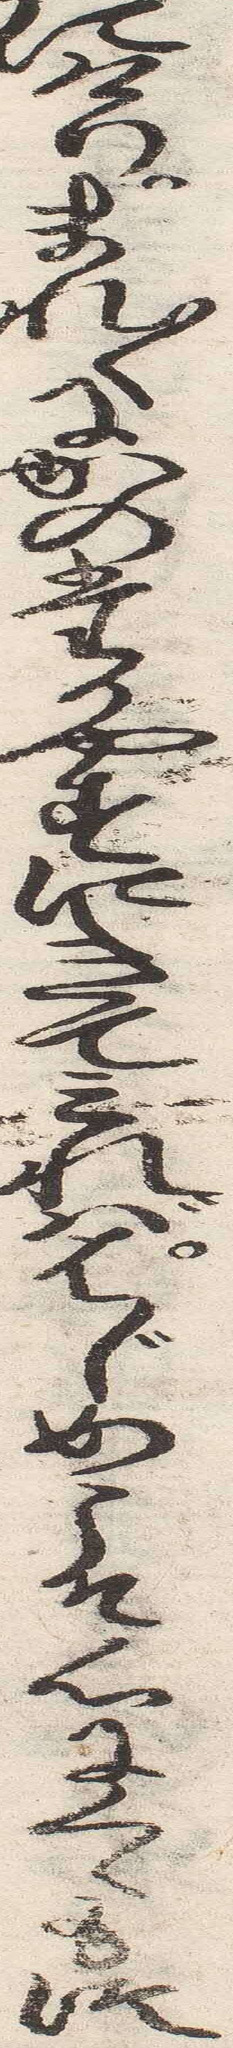にけり。まれ〳〵にかのたかやすにきてみれば。はじめこそ心にくゝもつ
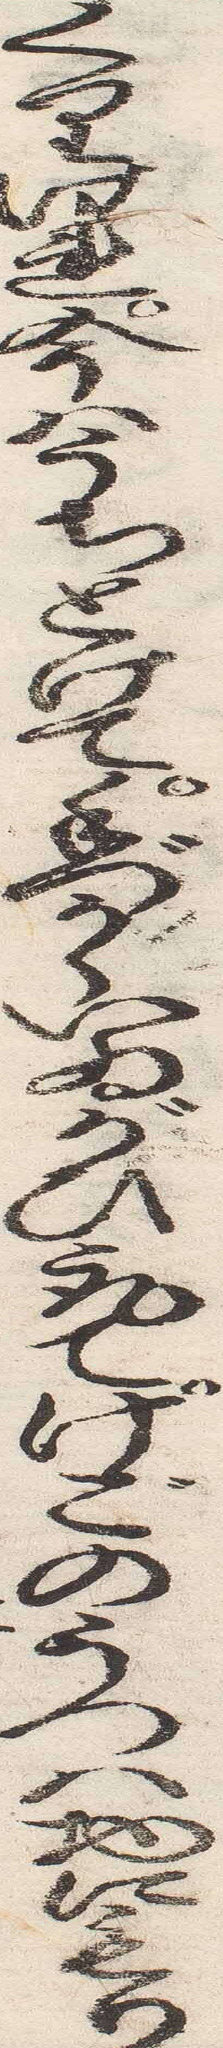くりけれ。今はうちとけて。手づからいゐがひ取て。けごのうつは物にもり
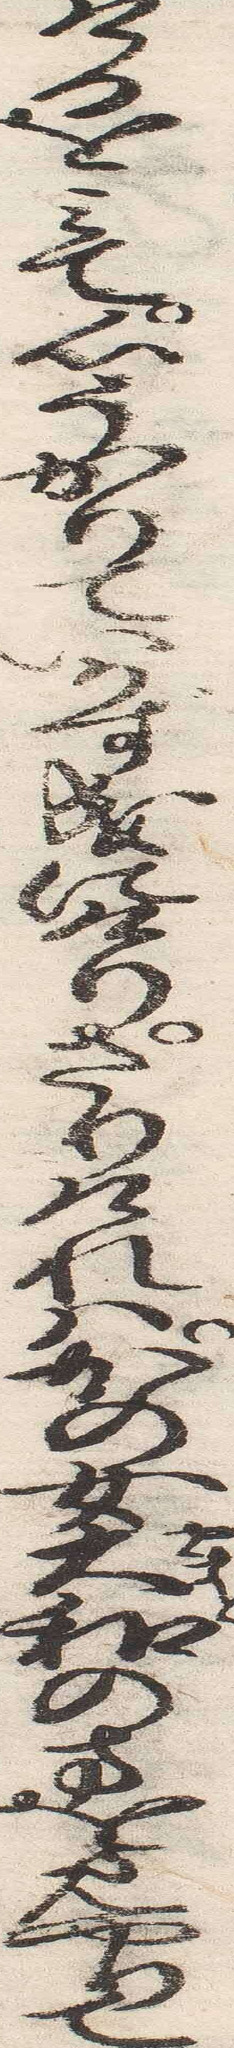けるをみて。心うかりていかず成にけり。さりけれは。かの女大和の方を見やりて
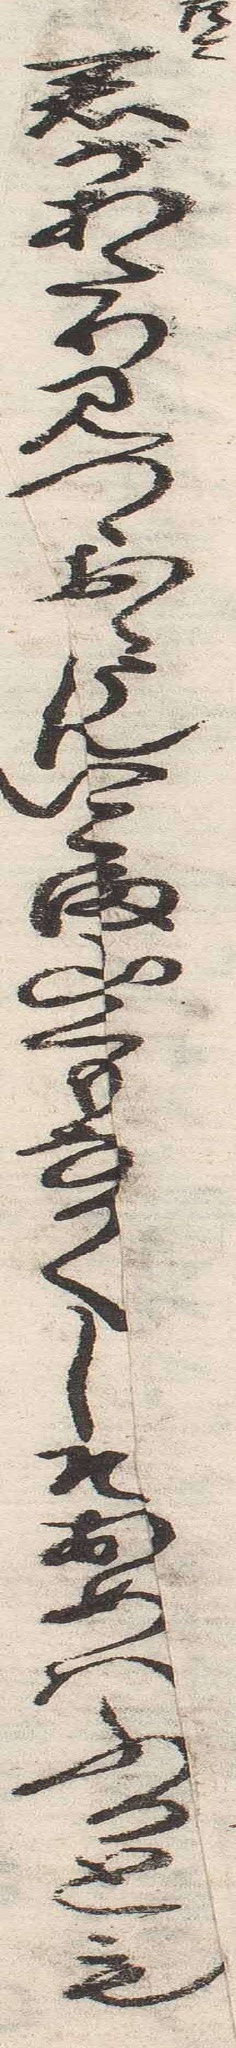新古今君があたり見つゝおくらんいこま山くもなかくしそあめはふるとも
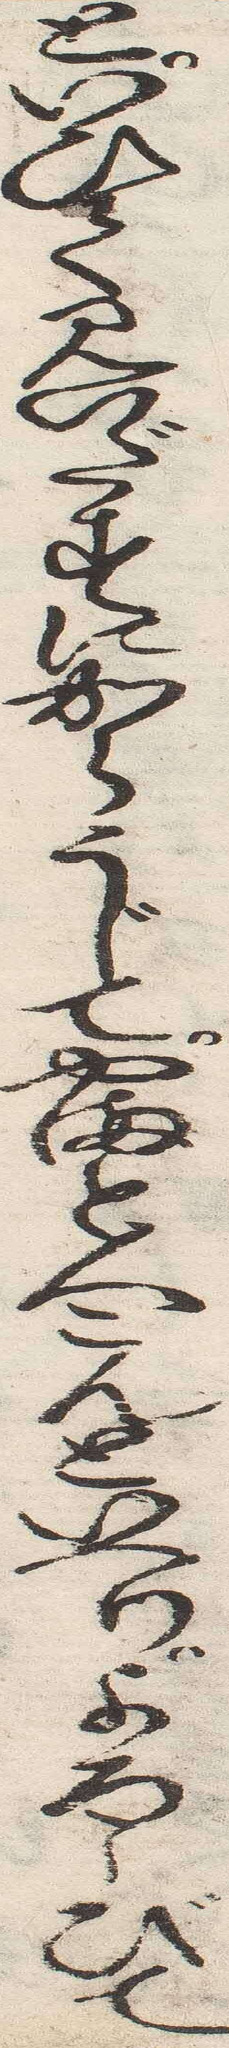と。いひて見いだすにからうじて。やまと人こんといへり。よろこびて
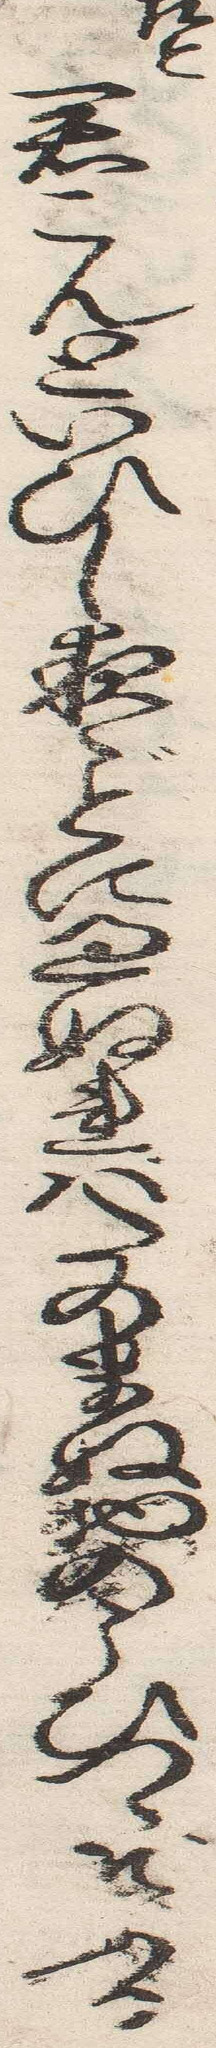古今君こんといひし夜ごとに過ぬればたのまぬ物のこひつゝぞふる
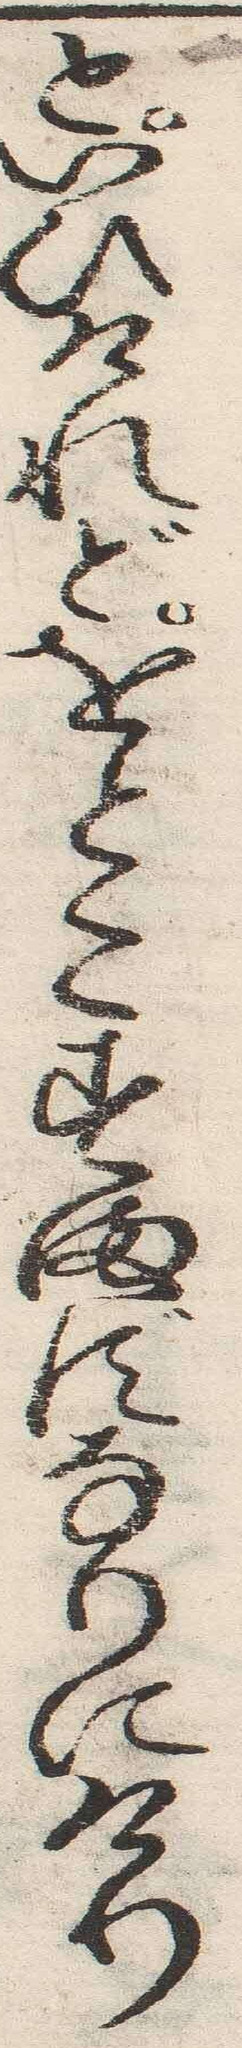と。いひけれど。をとこすまずなりにけり
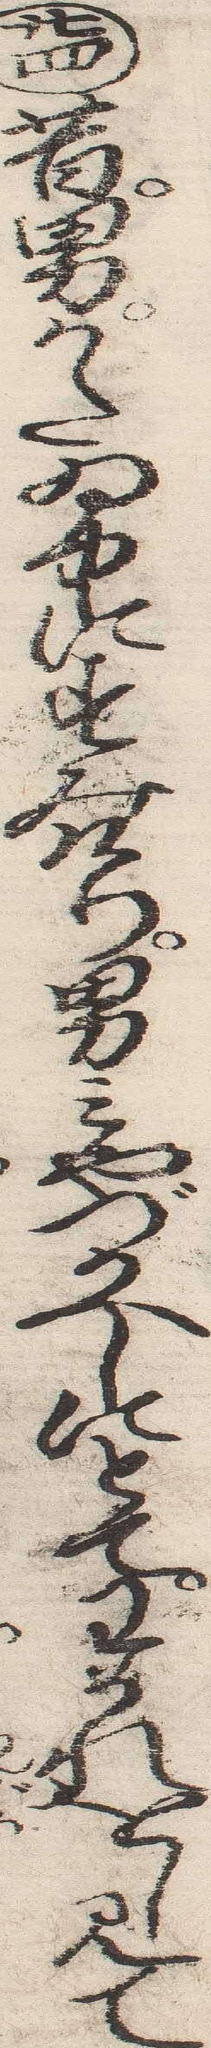廿四昔。男。かたゐ中にすみけり。男みやづかへしにとて。わかれをしみて
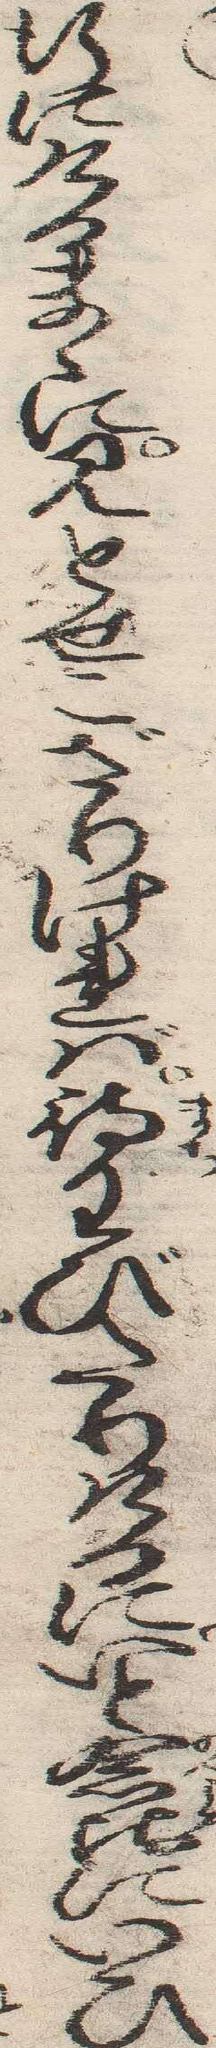行にけるまゝに。みとせこざりければ。待わびたりけるに。いと念比にいひ
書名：伊勢物語
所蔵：東京学芸大学附属図書館 国文学研究資料館
